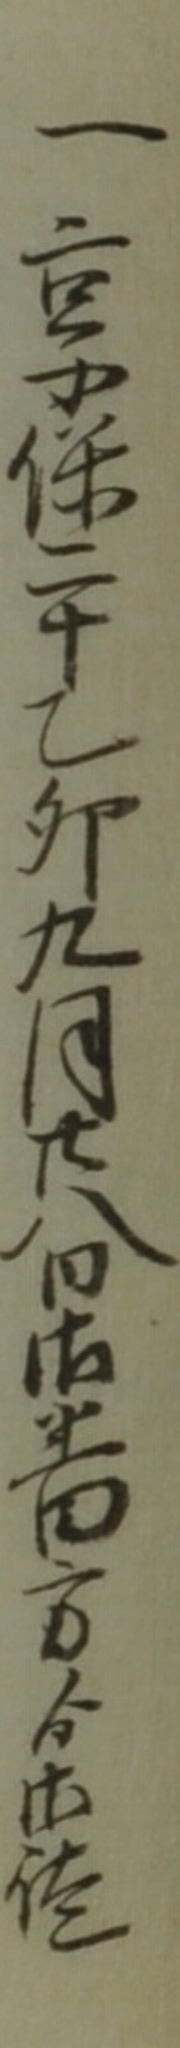一享保二十乙卯九月廿八日御番方ゟ御徒
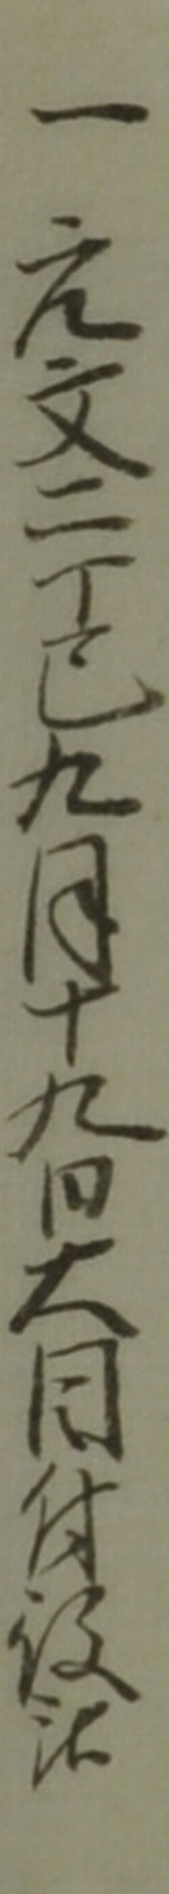一元文二丁巳九月十九日大目付役被
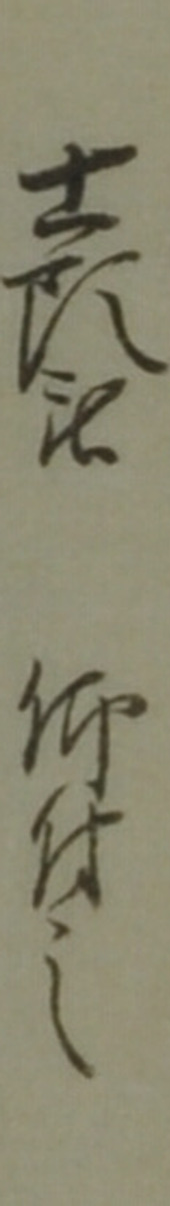士頭被仰付之
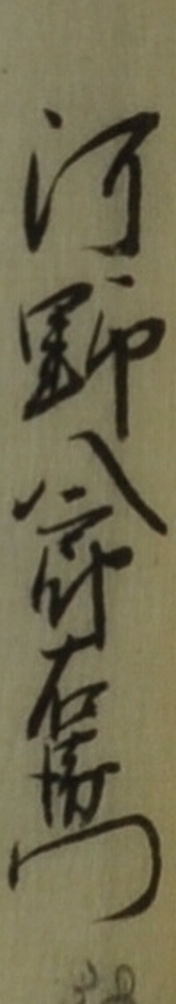河野八郎右衛門
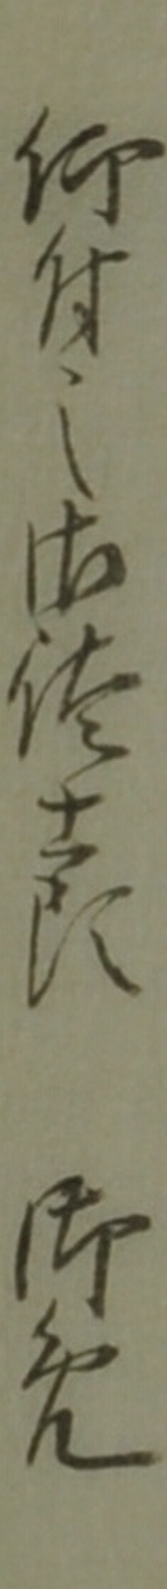仰付之御徒士頭御免
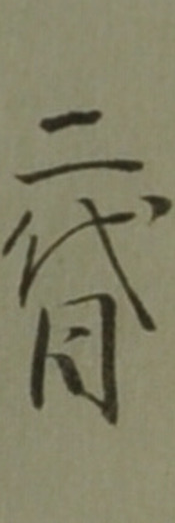二代目
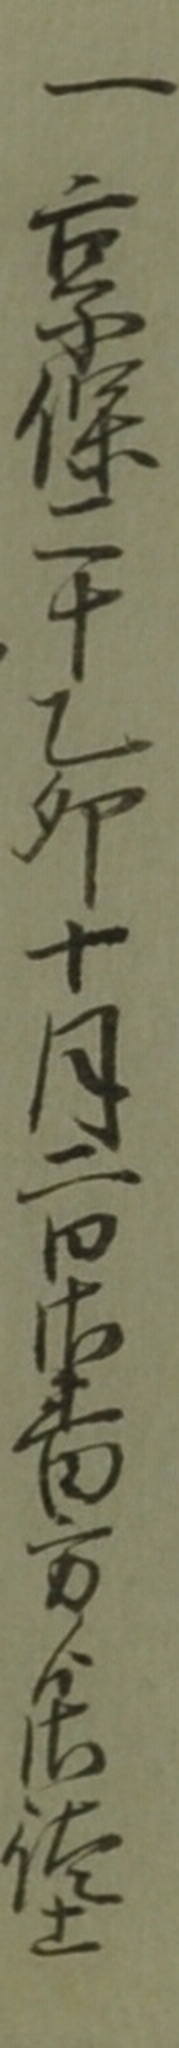一享保二十乙卯十月二日御番方ゟ御徒士
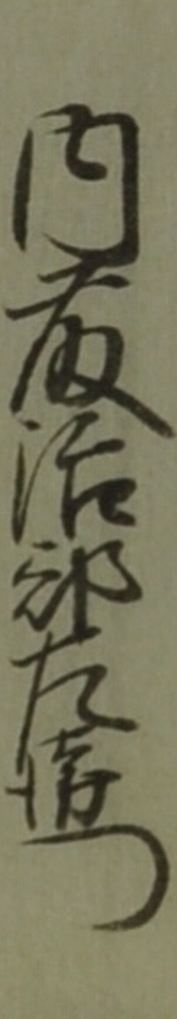内藤治部左衛門
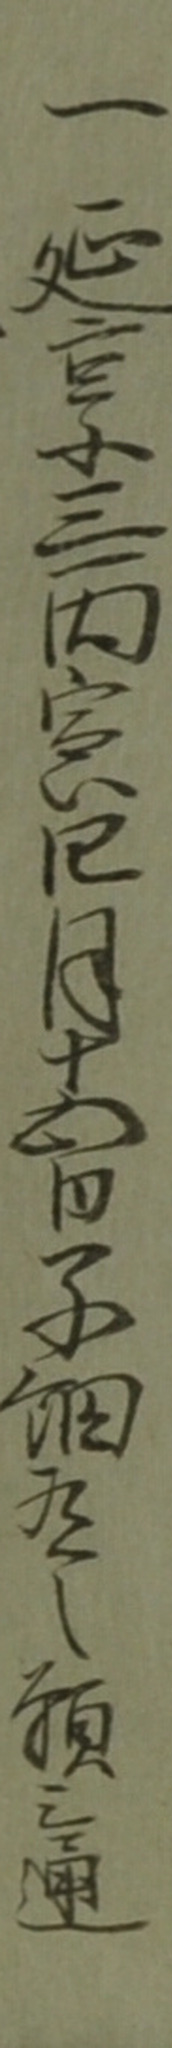一延享三丙寅四月十五日子細侯之願之通
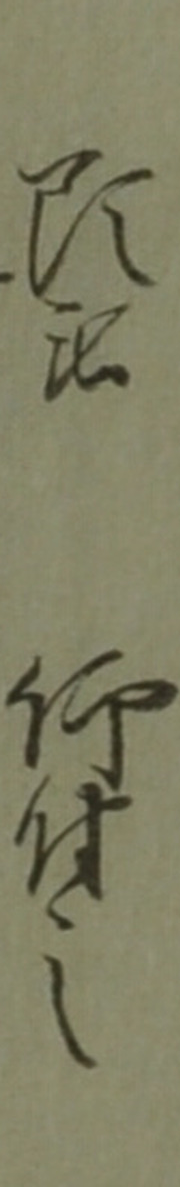士頭被仰付之
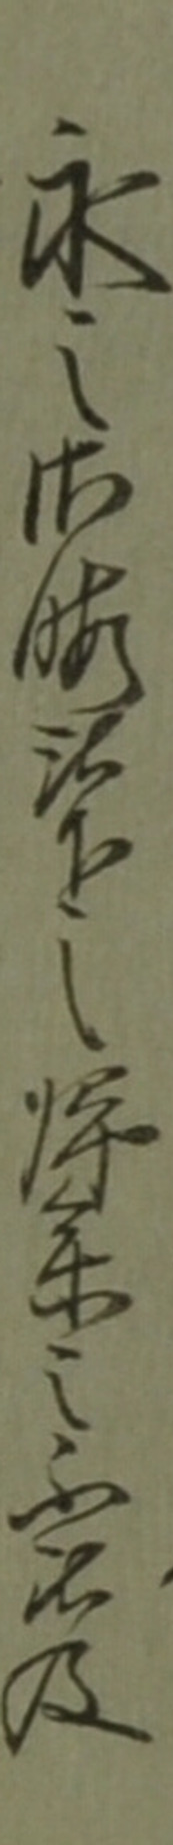永之御暇被下之帰参之不被及
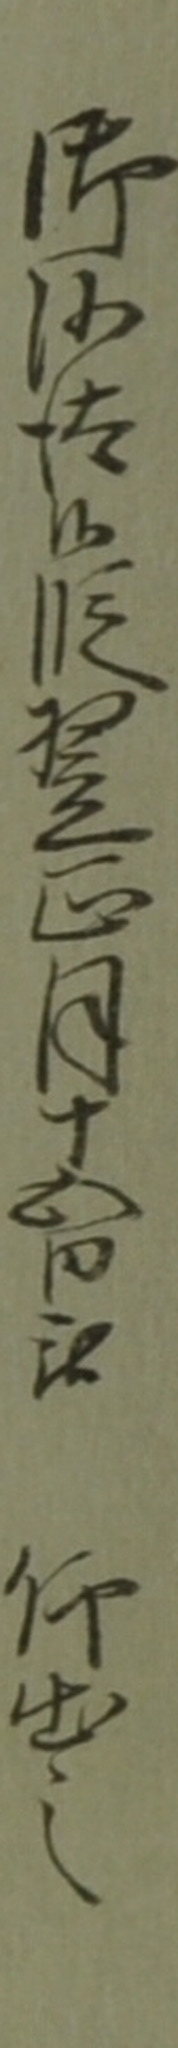御沙汰候段翌正月十五日被仰出之
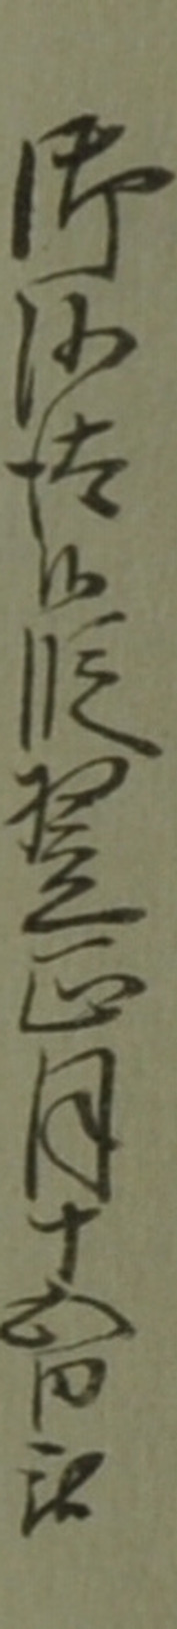御沙汰候段翌正月十五日被仰出之
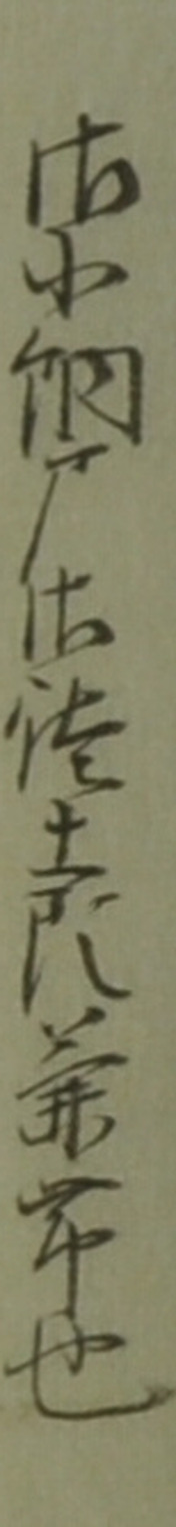御小納戸御徒士頭兼帯也
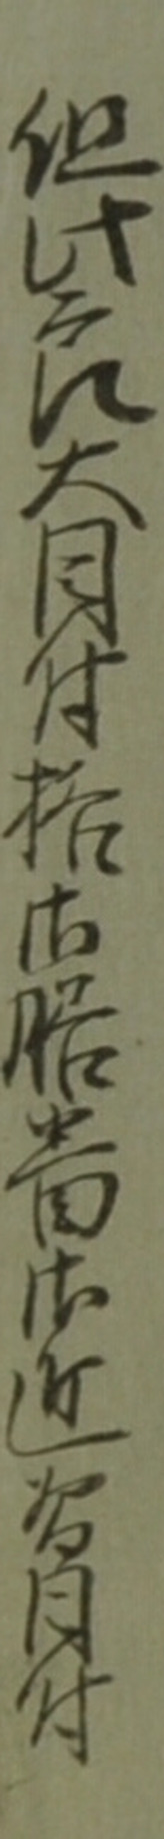但此節大目付格御膳番御近習目付

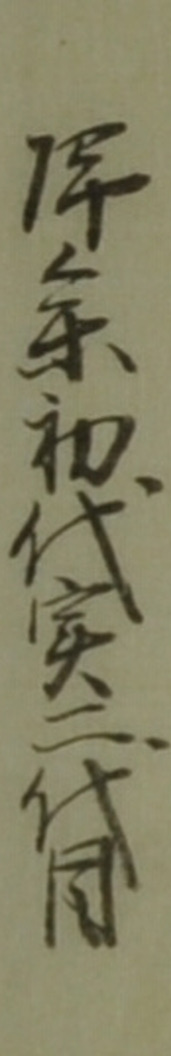帰参初代実二代目
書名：諸御役代々録（六）
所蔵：伊那市立高遠町図書館・合同会社AMANE
